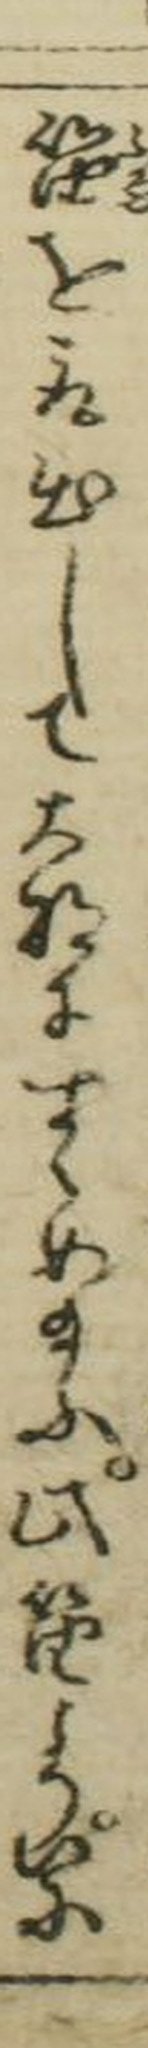笛を取出して大将にすゝめ給ふ。此笛より。いに
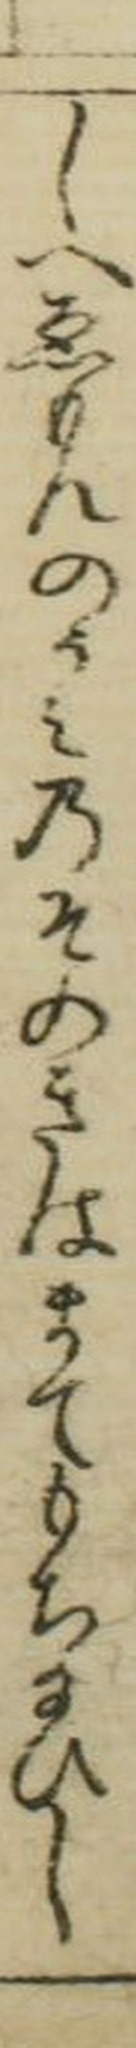しへゑもんかみのそのきはまてもち給ひし
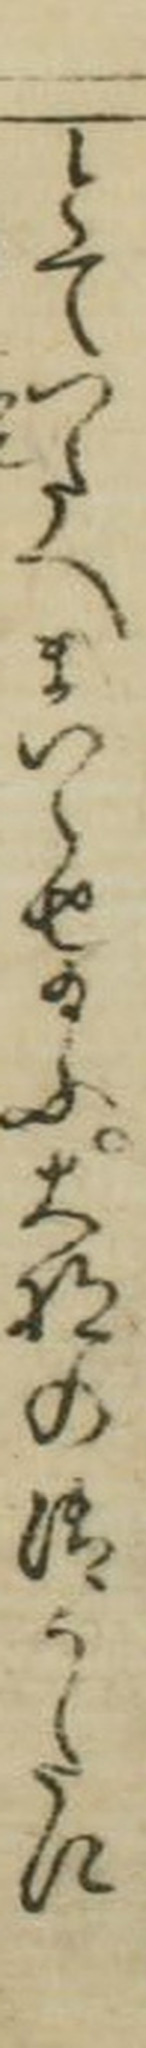とてつたへまいらせ給ふ。大将の御うたに
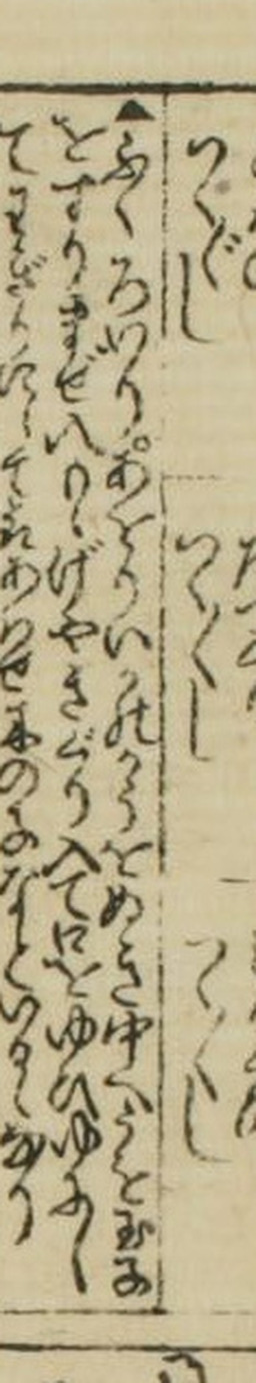▲ふくろいり。あをりいかのかうをぬき中へうを玉子
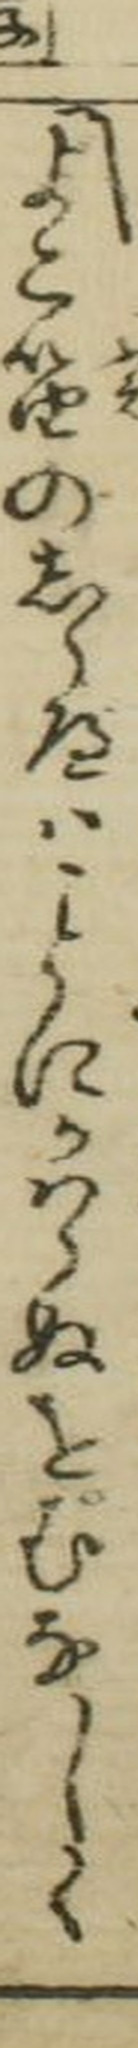〽よこ笛のしらへはことにかはらぬを。むなしく
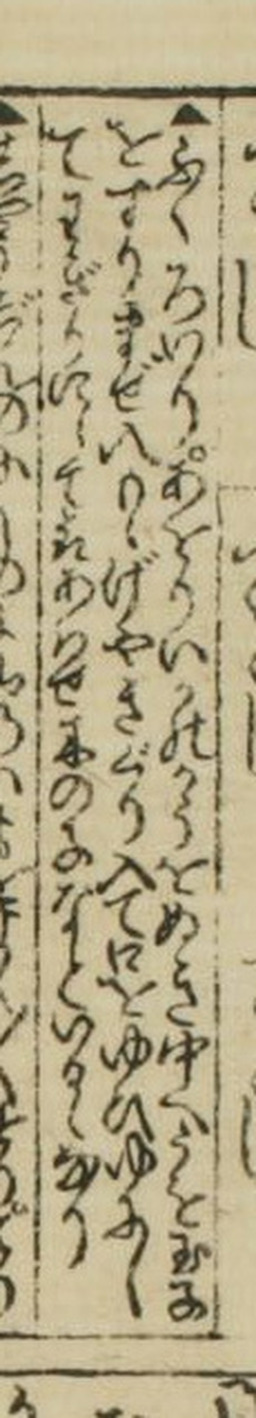をすりまぜ入もゝげやきぐり入て口をゆひゆにし
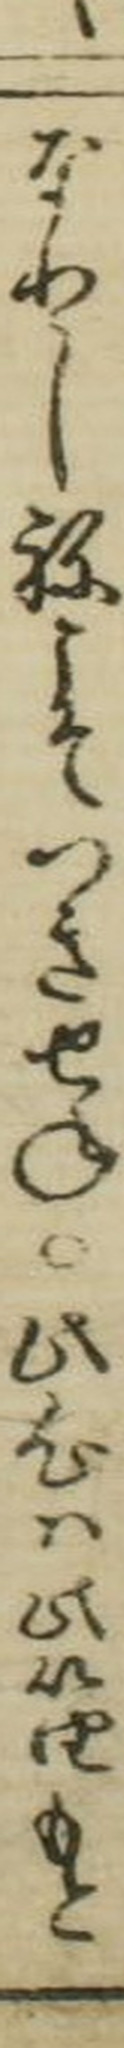なりしねこそつきせね◯此心は此笛もと
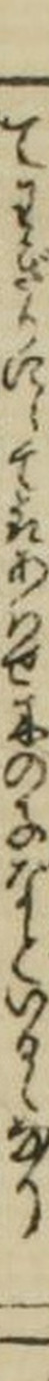てわぎりにして取あはせ木の子なといるゝなり
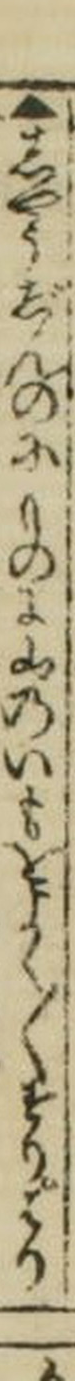▲しやうじんのにものに山のいもをよく〳〵すり。はり
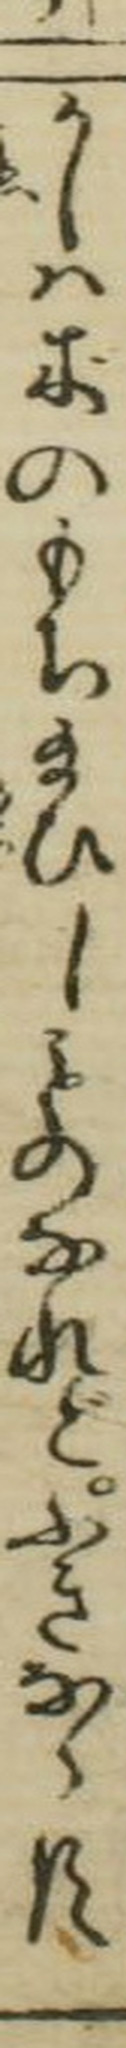かしはぎのもち給ひしものなれど。ふきならす
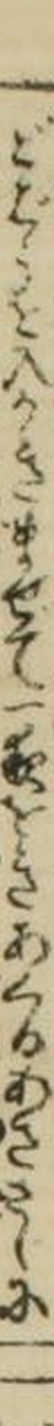ごばうを入かきまぜて一夜をきあくるあささじに
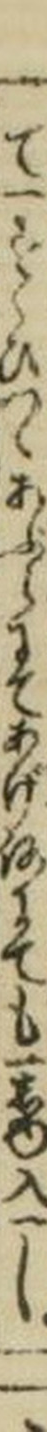て一すくひつゝあぶらにてあげ何にても一しゆ入へし
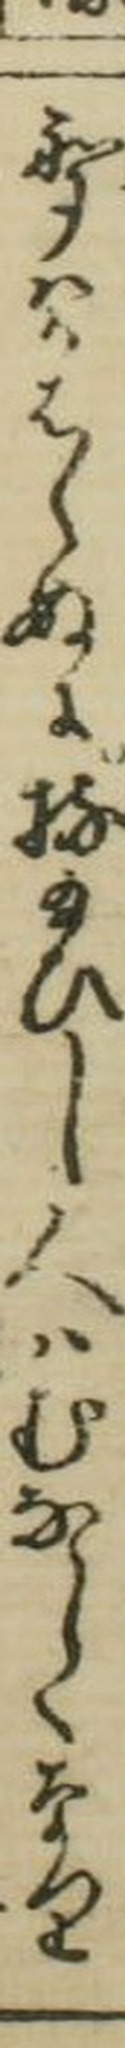声はかはらぬに。持給ひし人はむなしくなり
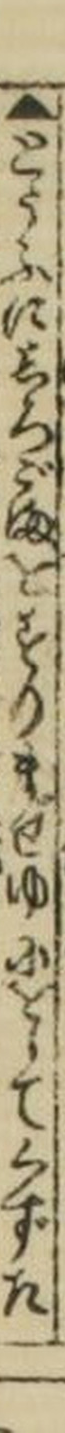▲とうふにしろごまをすりまぜゆにをしてくずた
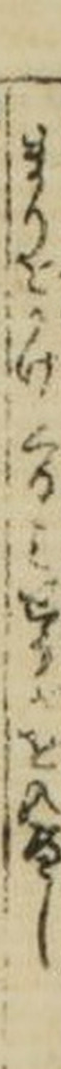まりをかけくるみせうがを入へし
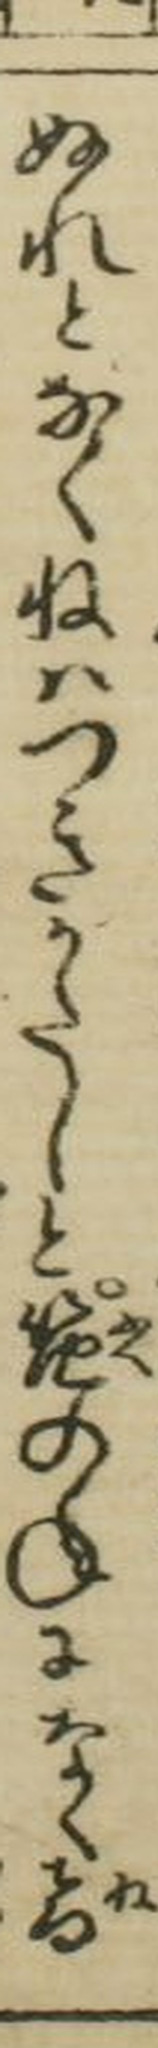ぬれとなくねはつきかたしと。笛のねになく音
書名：女源氏教訓鑑
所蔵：東京学芸大学附属図書館
